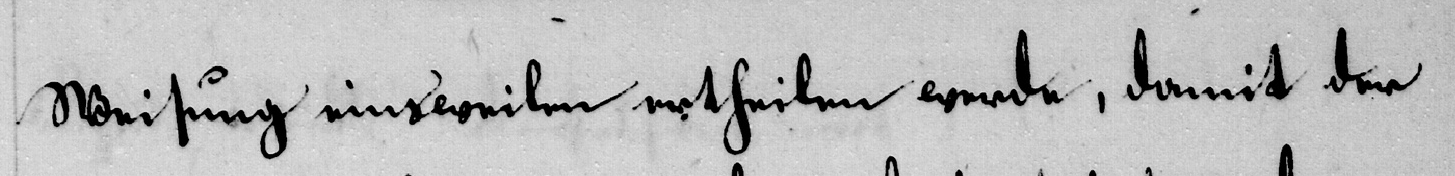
Weisung einsweilen ertheilen werde, damit der
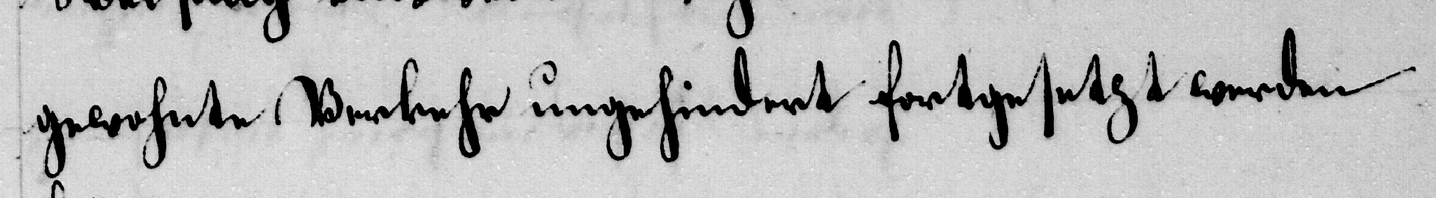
gewohnte Verkehr ungehindert fortgesetzt werden
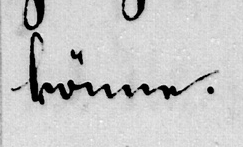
könne.
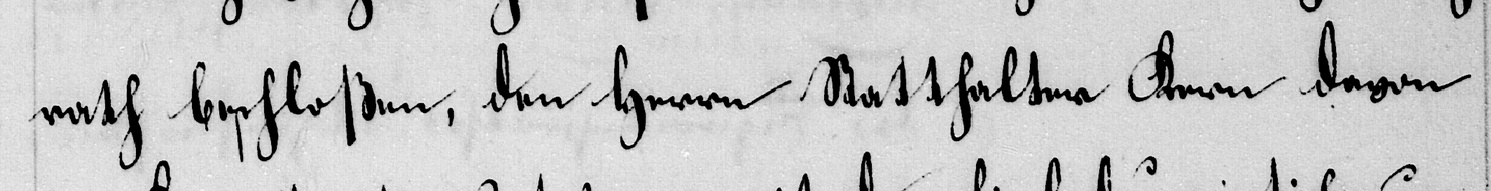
rath beschloßen, den Herrn Statthalter Kern davon
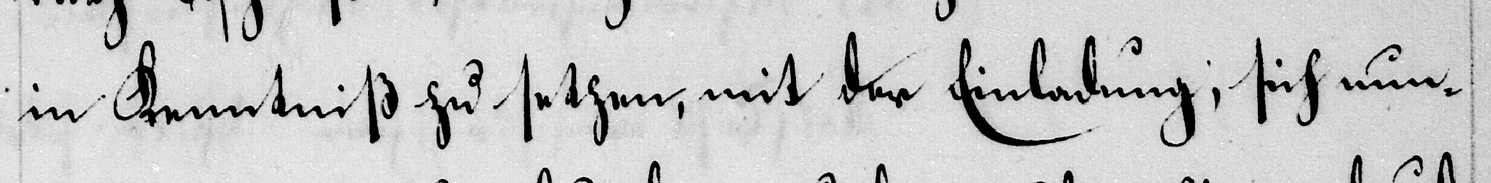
in Kenntniß zu setzen, mit der Einladung, sich nun¬
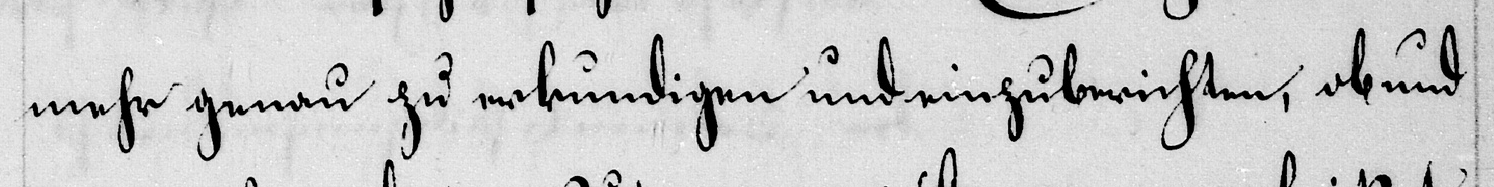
mehr genau zu erkundigen und einzuberichten, ob und
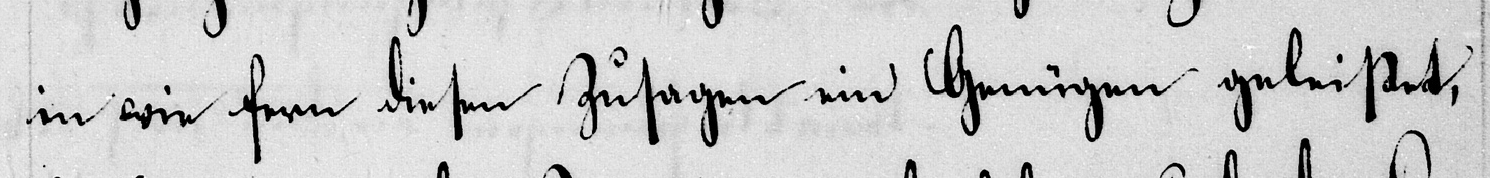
in wie fern diesen Zusagen ein Genügen geleistet,
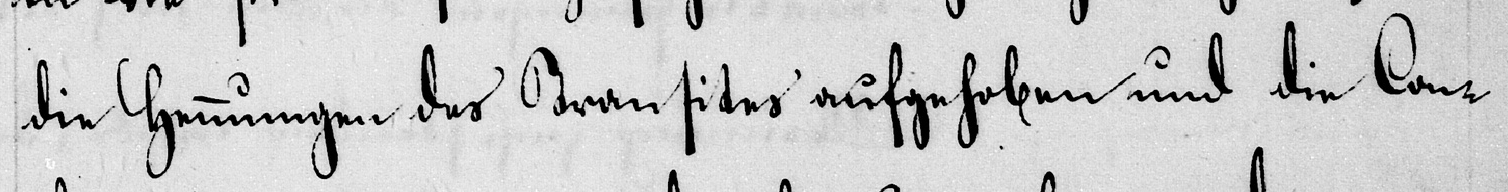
die Hemmungen des Transites aufgehoben und die Con¬
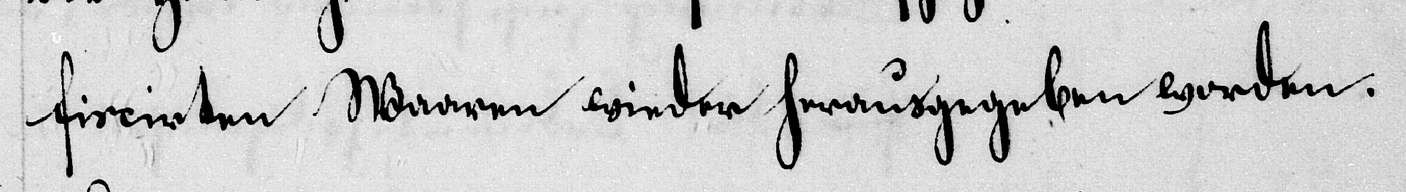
fiscirten Waaren wieder Herausgegeben worden.
